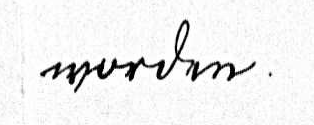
worden.
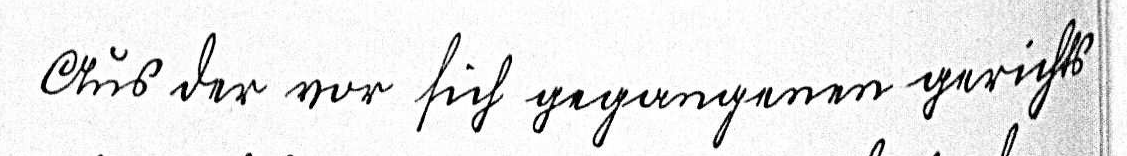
Aus der vor sich gegangenen gerichts¬
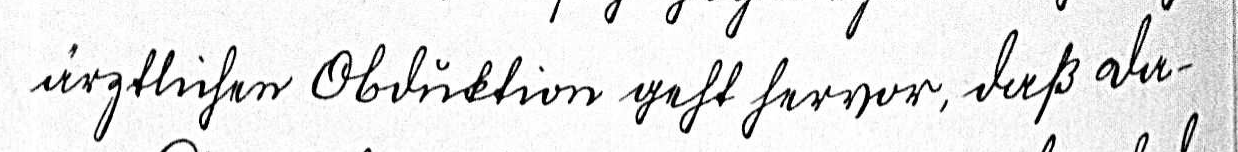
ärztlichen Obduktion geht hervor, daß Da¬
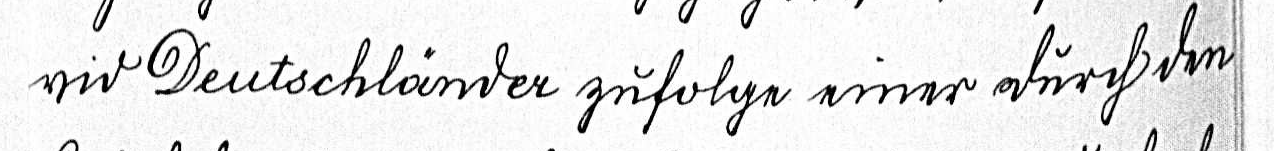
vid Deutschländer zufolge einer durch den
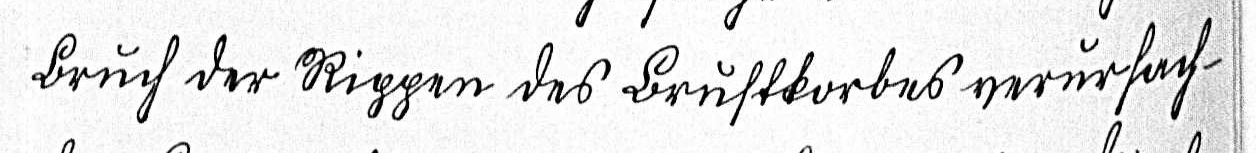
Bruch der Rippen des Brustkorbes verursach¬
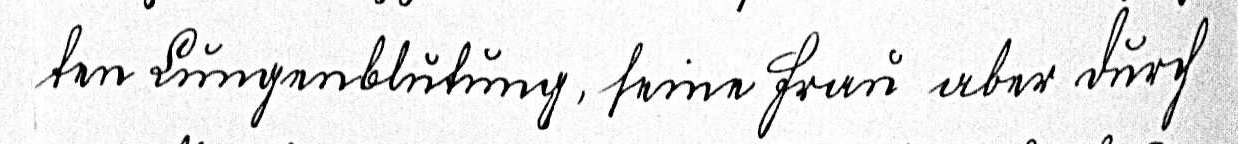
ten Lungenblutung, seine Frau aber durch
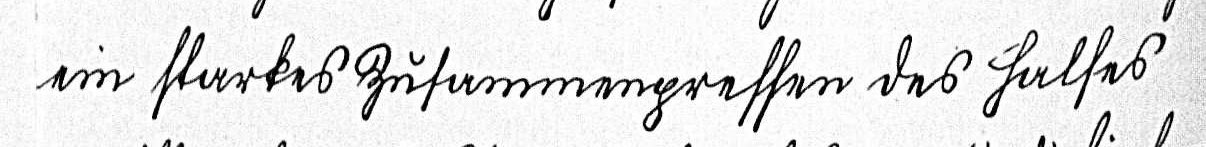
ein starkes Zusammenpressen des Halses
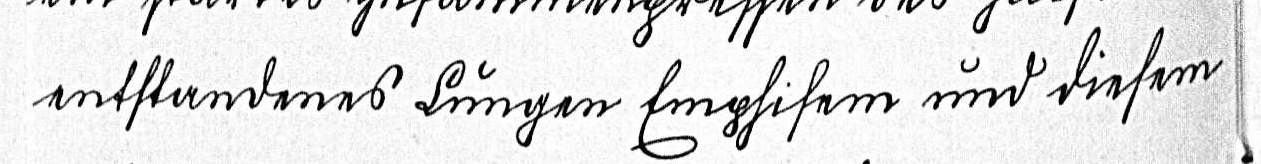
entstandenes Lungen Emphisem und Diesem
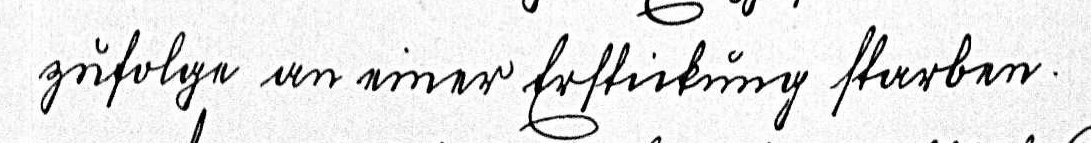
zufolge an einer Erstickung starben.
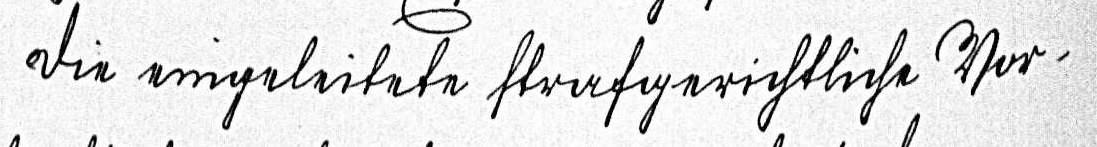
Die eingeleitete strafgerichtliche Vor¬
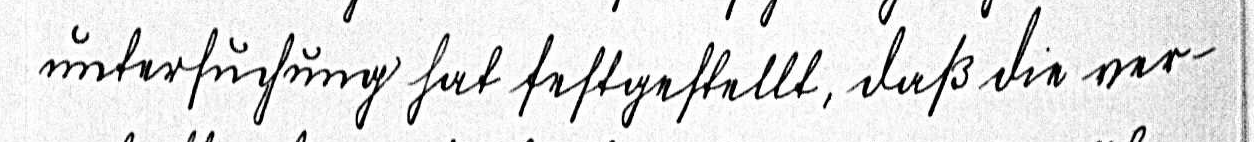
untersuchung hat festgestellt, daß die ver¬
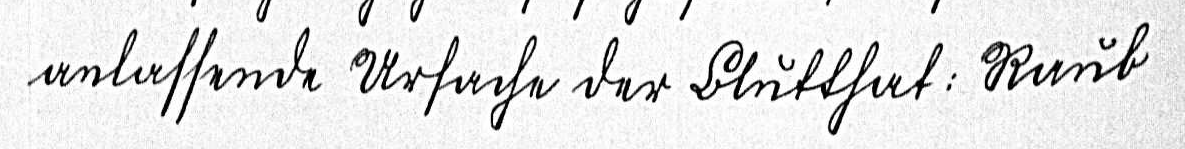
anlassende Ursache der Blutthat: Raub
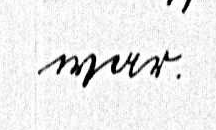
war.
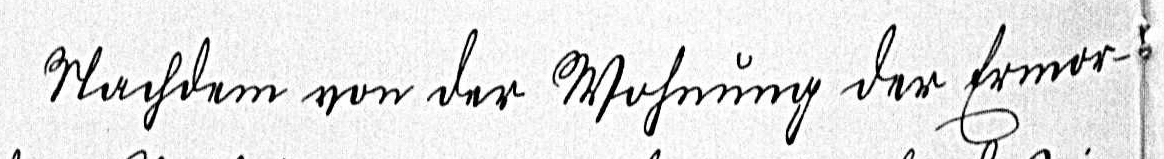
Nachdem von der Wohnung der Ermor¬
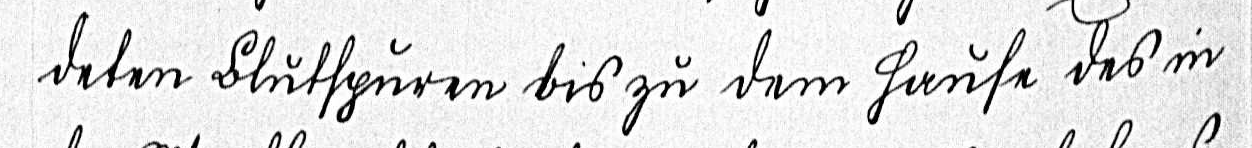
deten Blutspuren bis zu dem Hause des in
